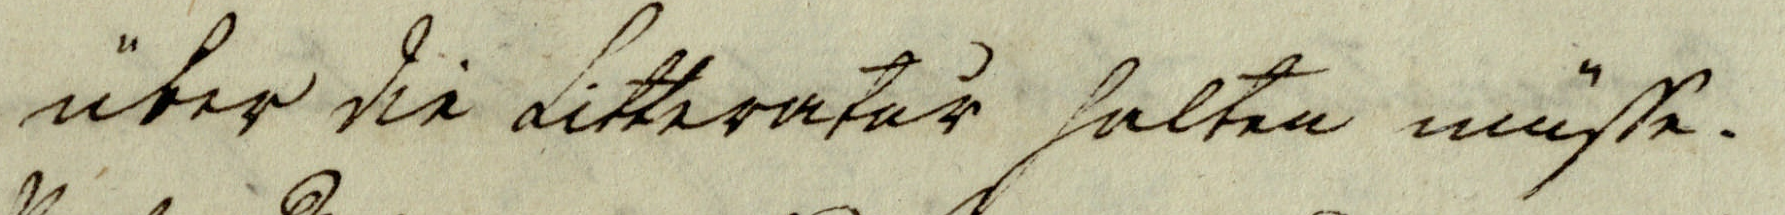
über die Litteratur halten müsse.
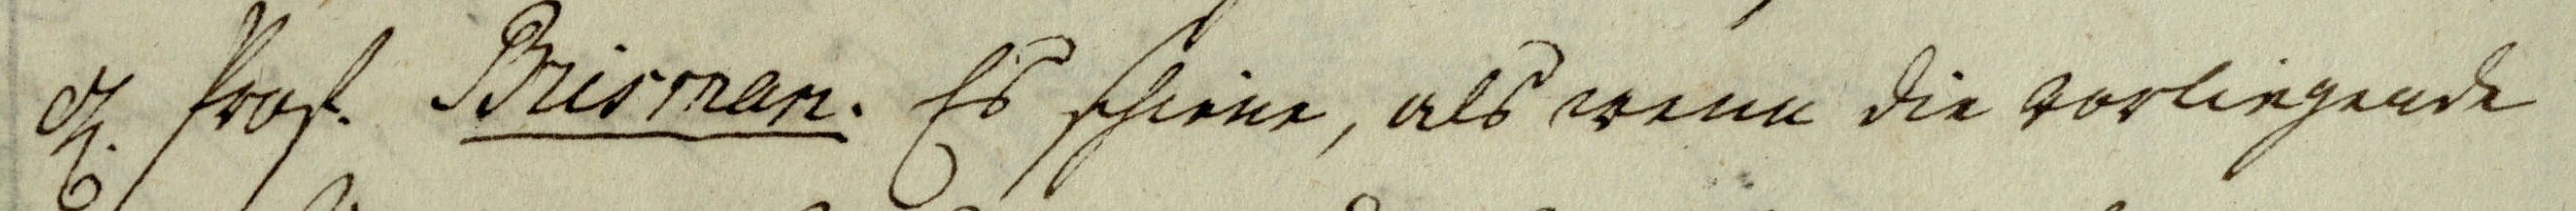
dh. Prof. Brisman. Es scheine, als wenn die vorliegende
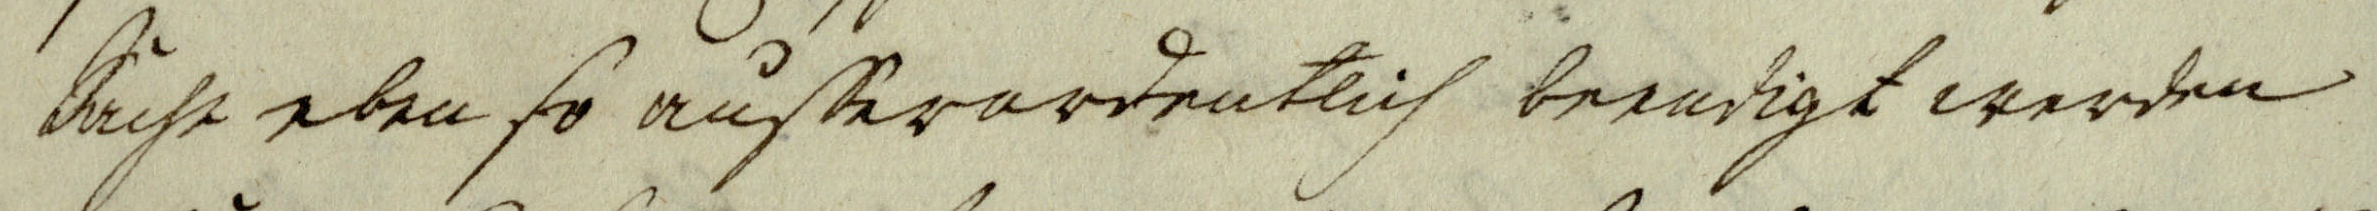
Sache eben so ausserordentlich beendigt werden
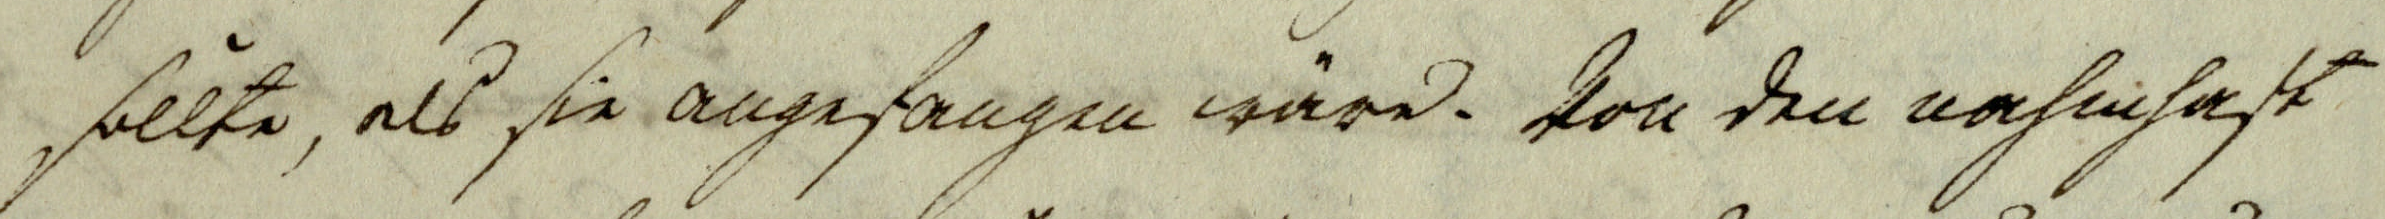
sollte, als sie angefangen wäre. Von den nahmhaft
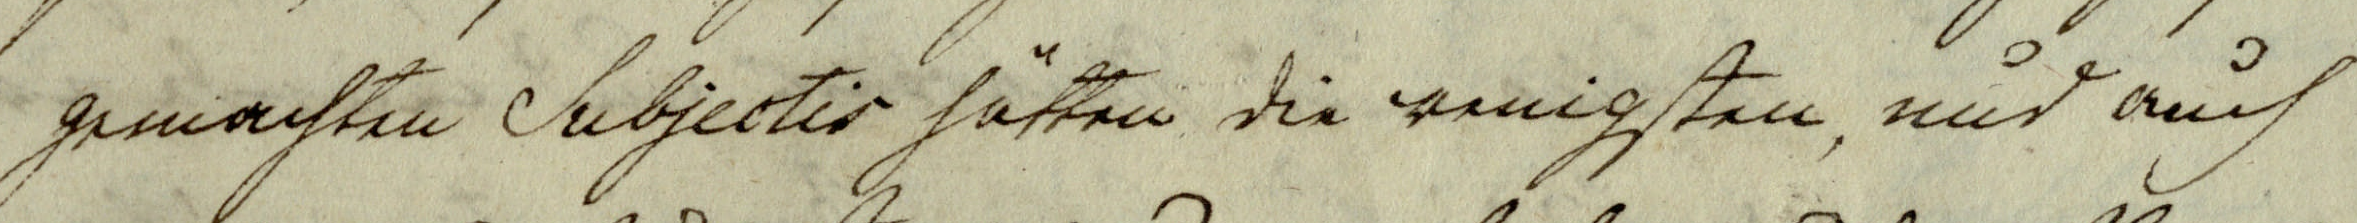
gemachten Subjectis hätten die wenigsten, und auch
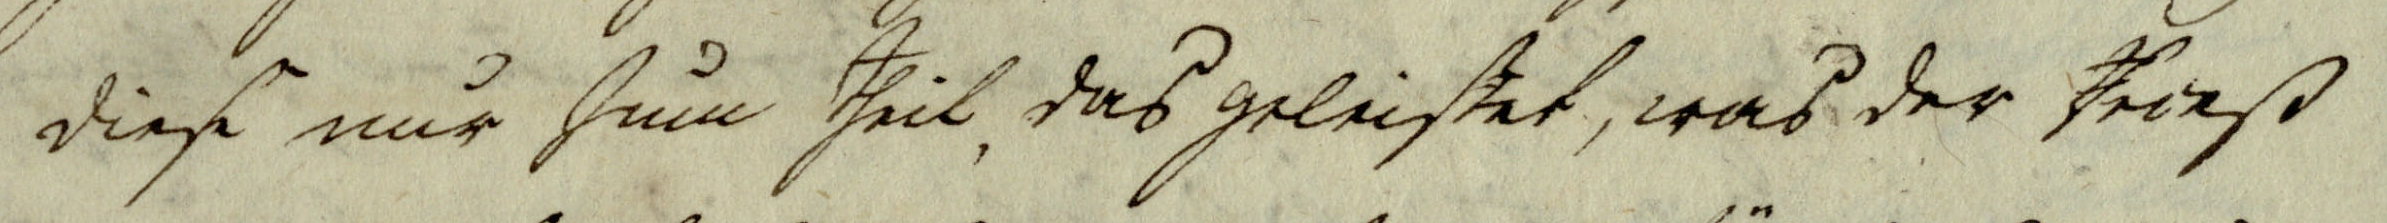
diese nur zum Theil, das geleistet, was der Receß
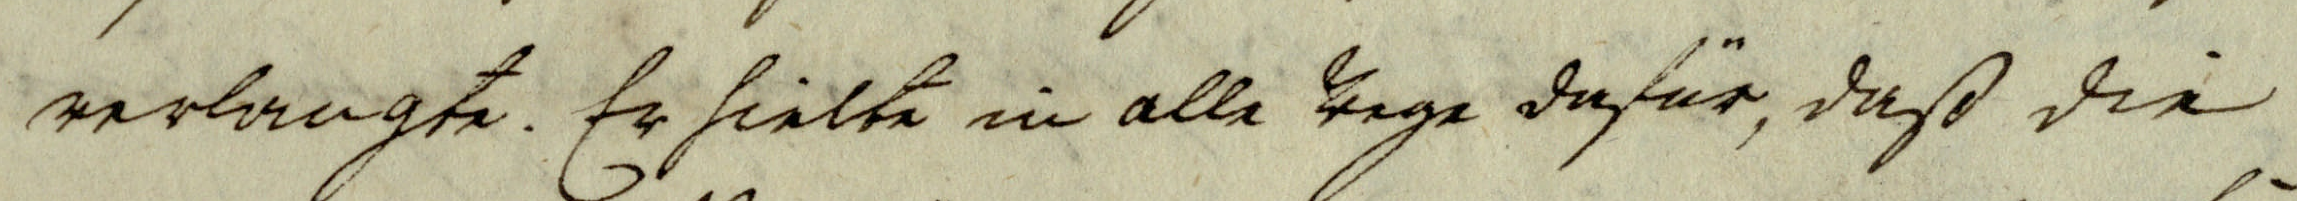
verlangte. Er hielte in alle Wege dafür, daß die
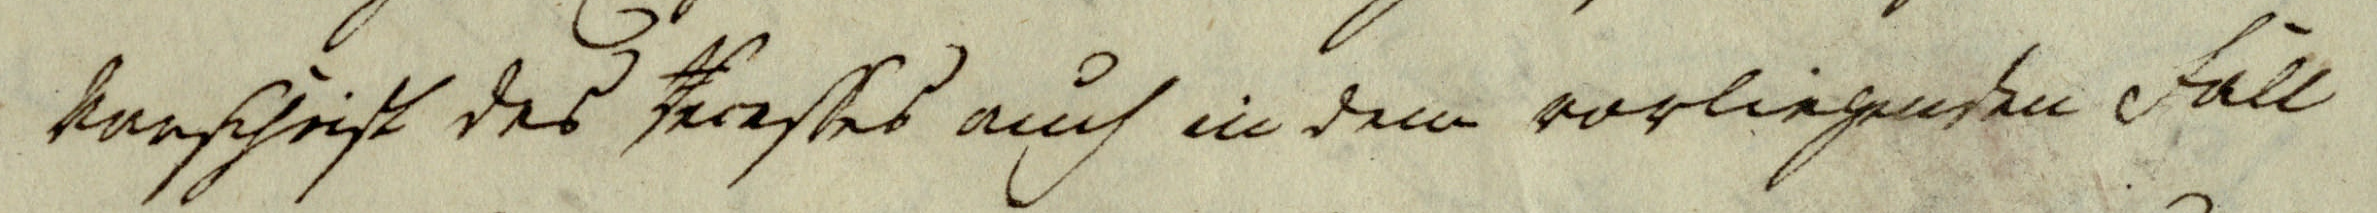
Vorschrift des Recesses auch in dem vorliegenden Fall
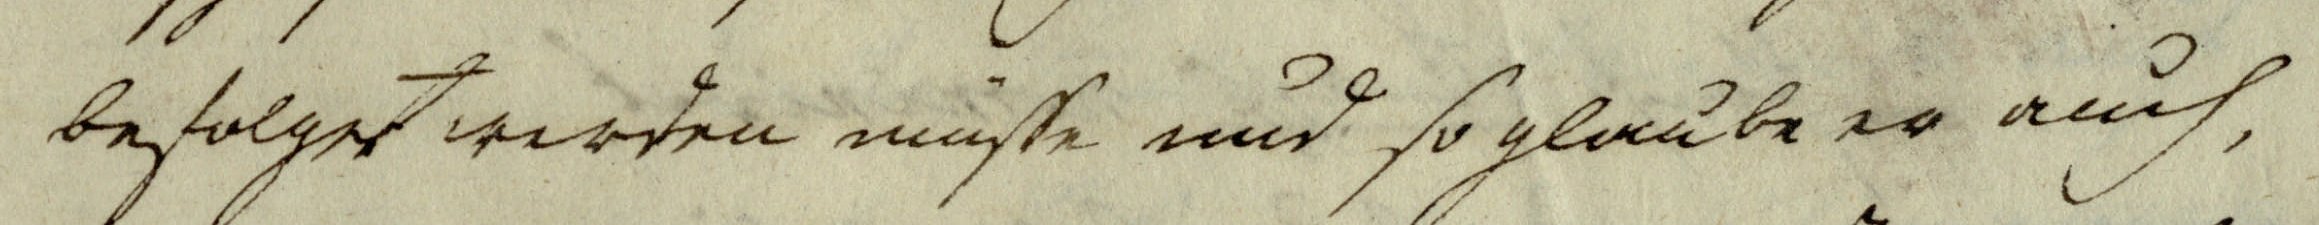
befolget werden müsse und so glaube er auch,
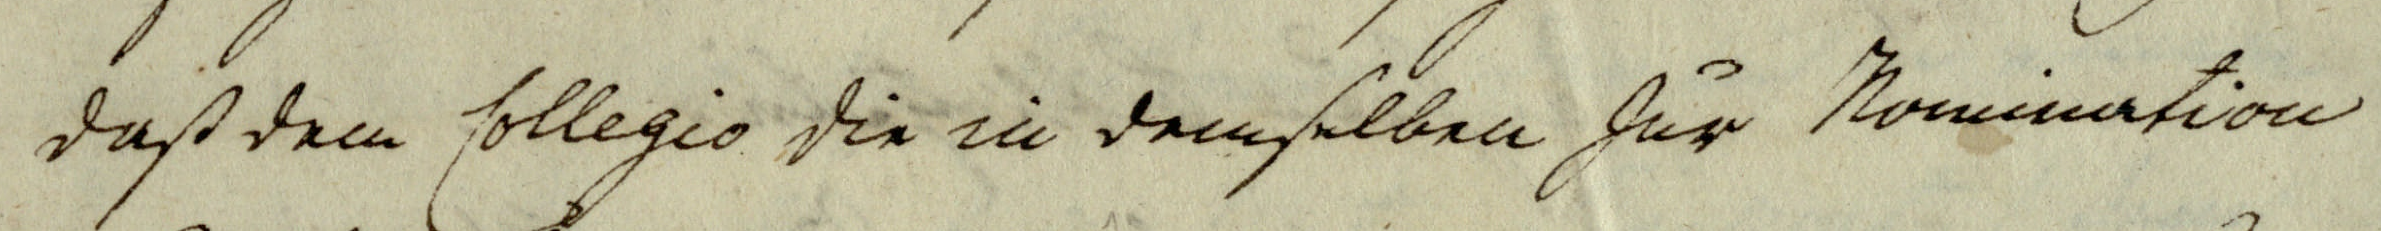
daß dem Collegio die in demselben zur Nomination
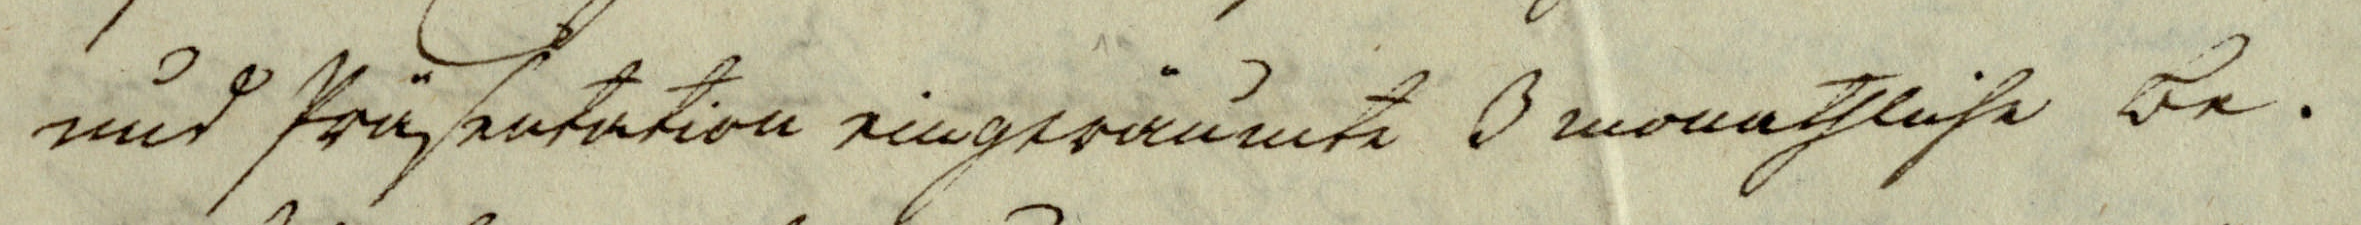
und Präsentation eingeräumte 3 monatliche Be¬
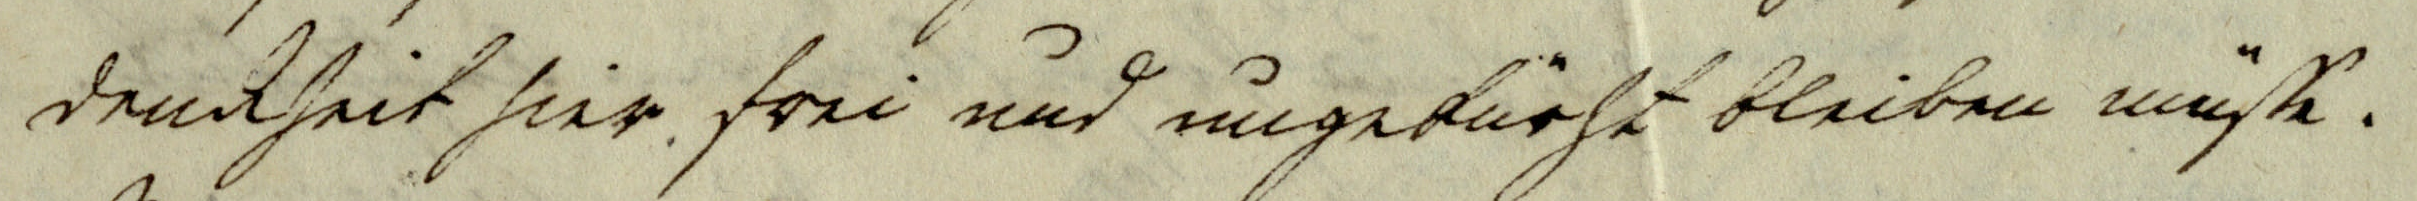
denkzeit hier frei und ungekürzt bleiben müsse.
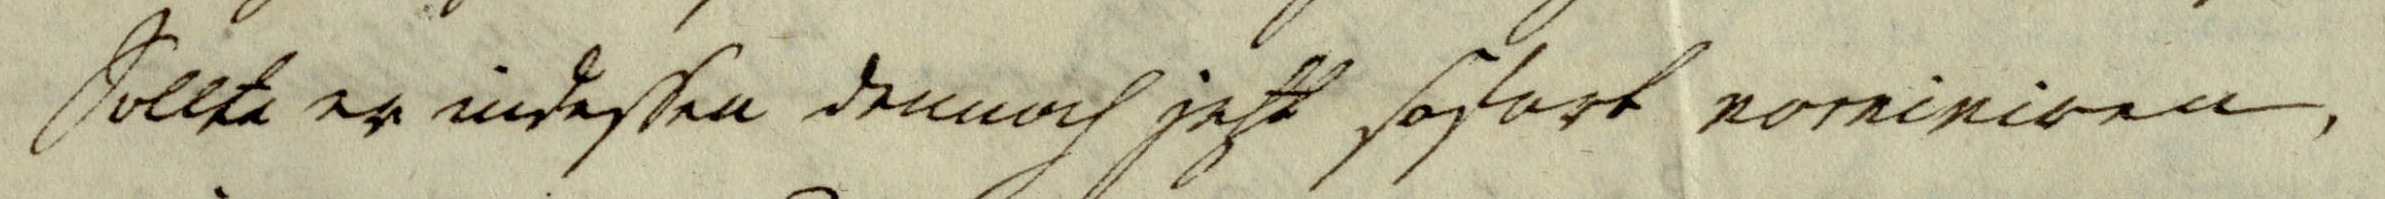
Sollte er indessen dennoch jetzt sofort nominiren,
